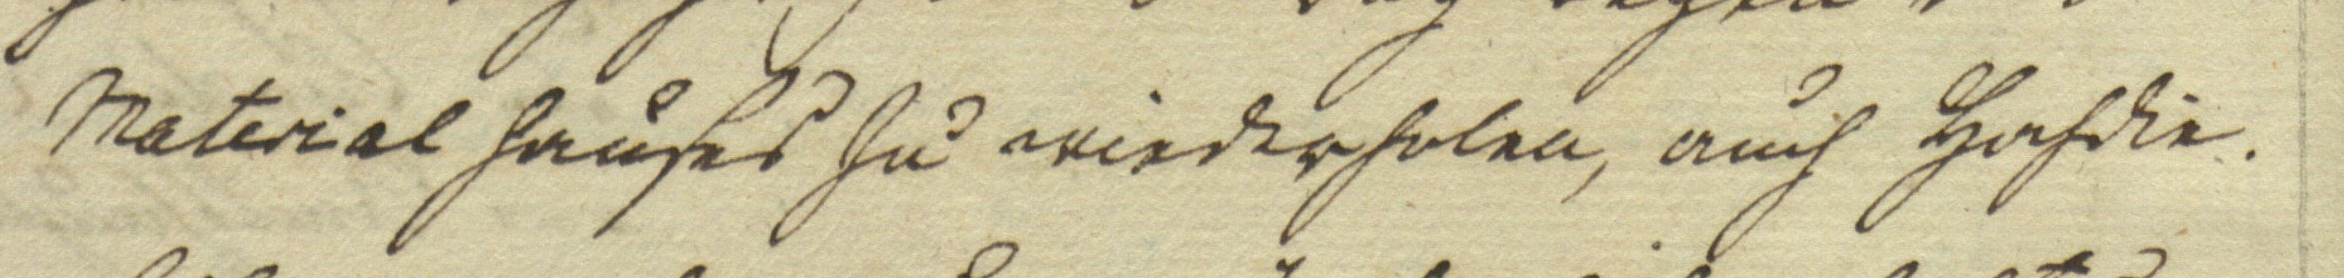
Material hauses zu wiederholen, auch Hochdie¬
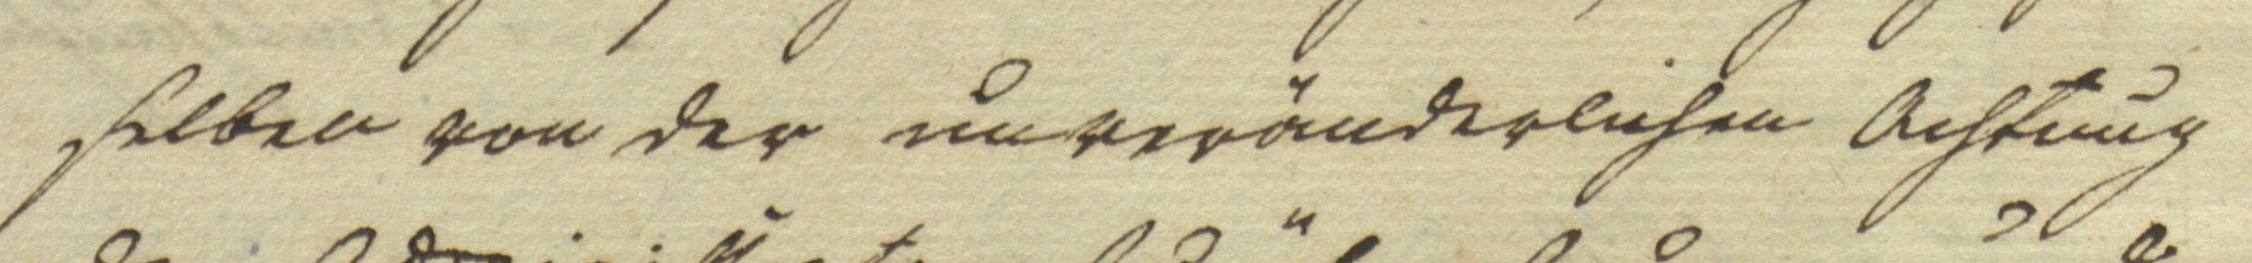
selben von der unveränderlichen Achtung
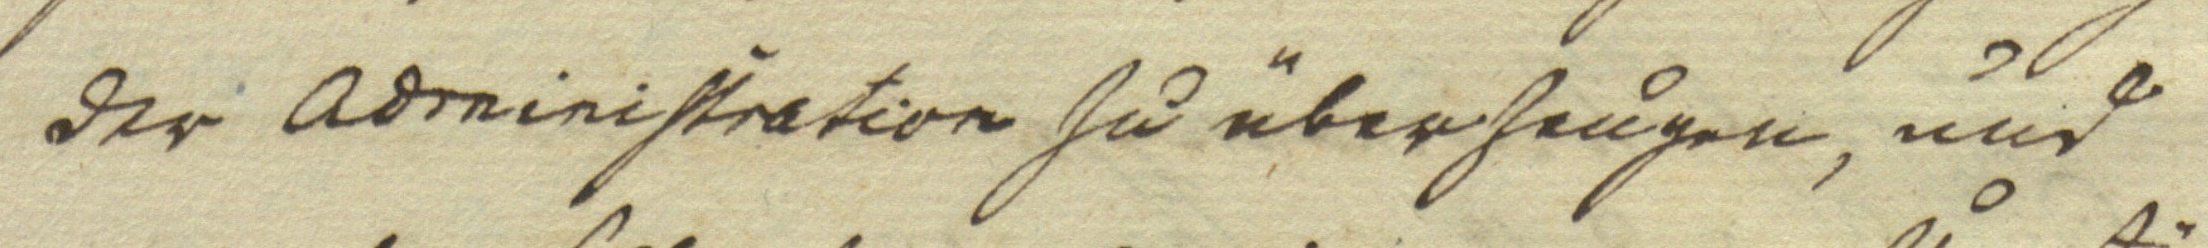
der Administration zu überzeugen, und
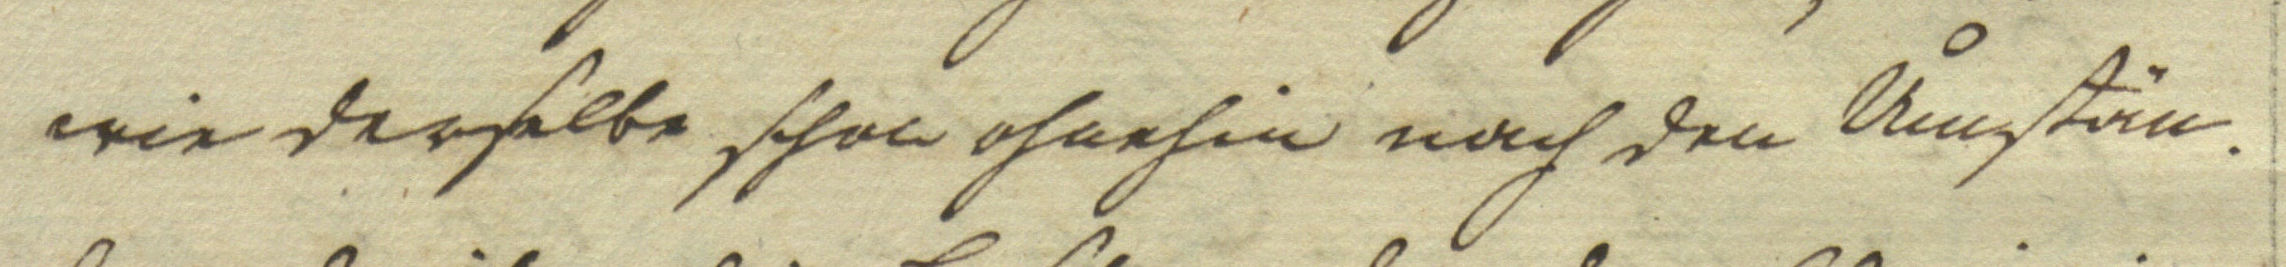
wie derselbe schon ohnehm nach den Umstän¬
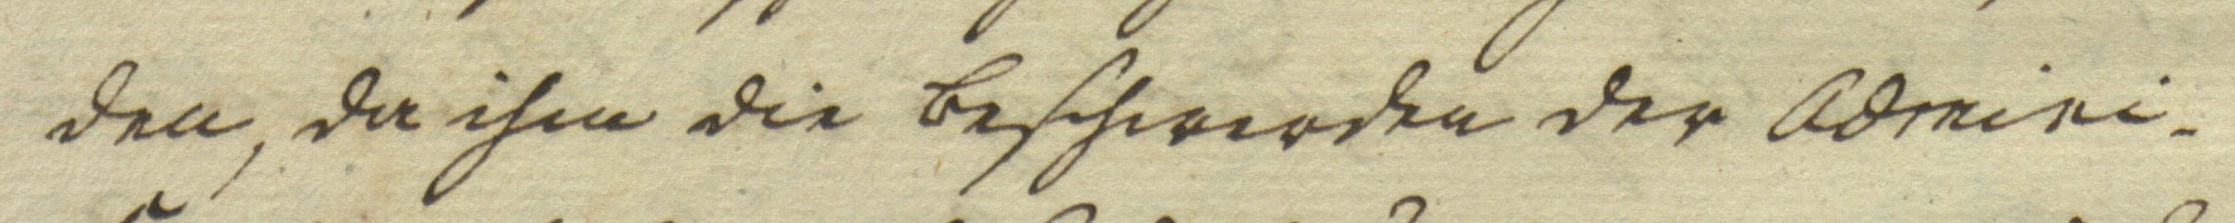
den, da ihm die Beschwerden der Admini¬
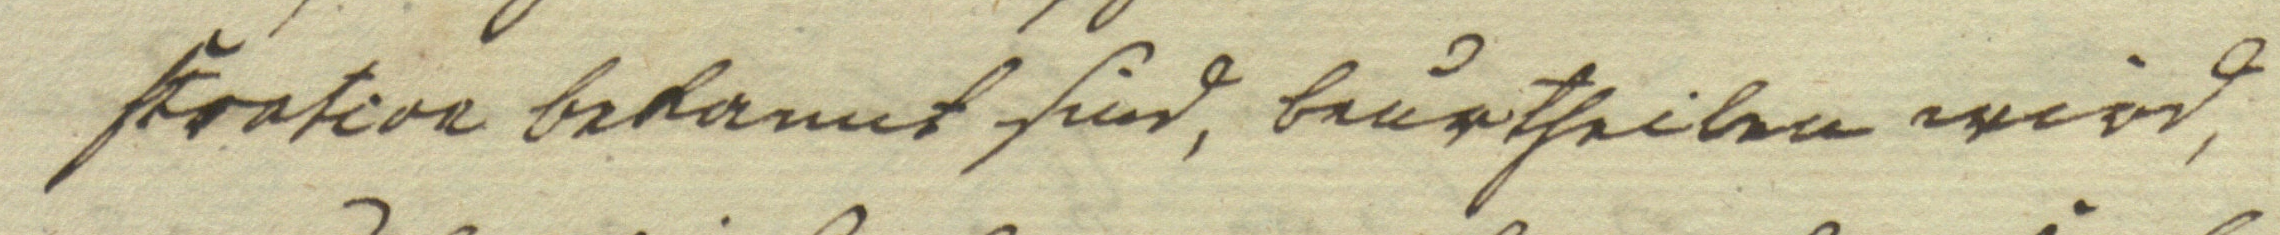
stration bekannt sind, beurtheilen wird,
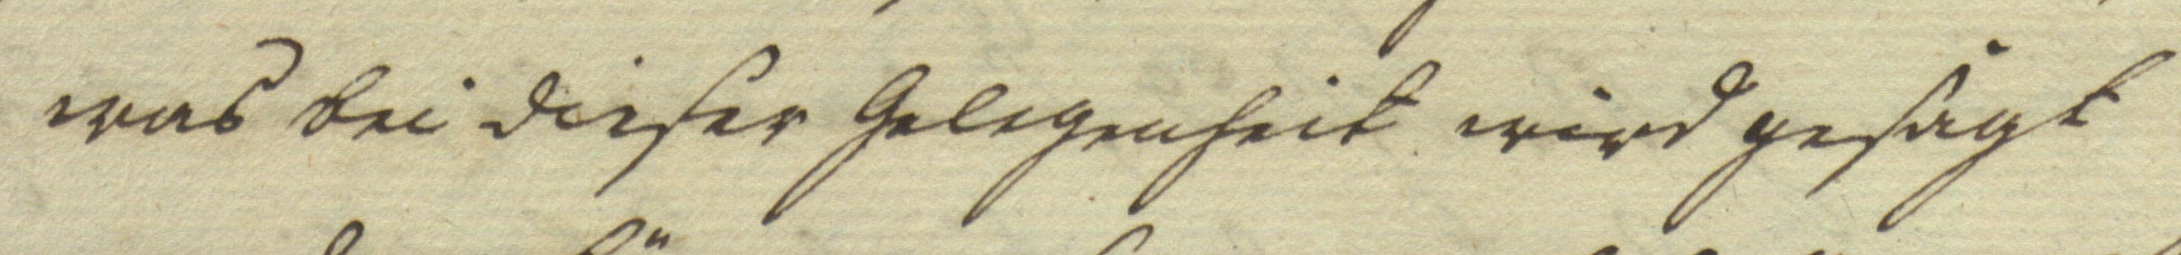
was bei dieser Gelegenheit wird gesagt
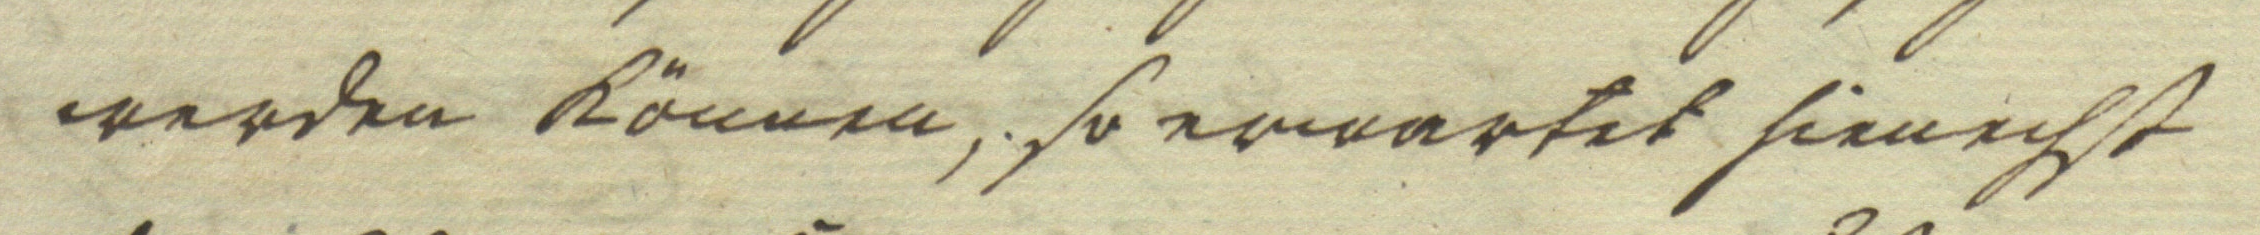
werden können, so erwartet hienechst
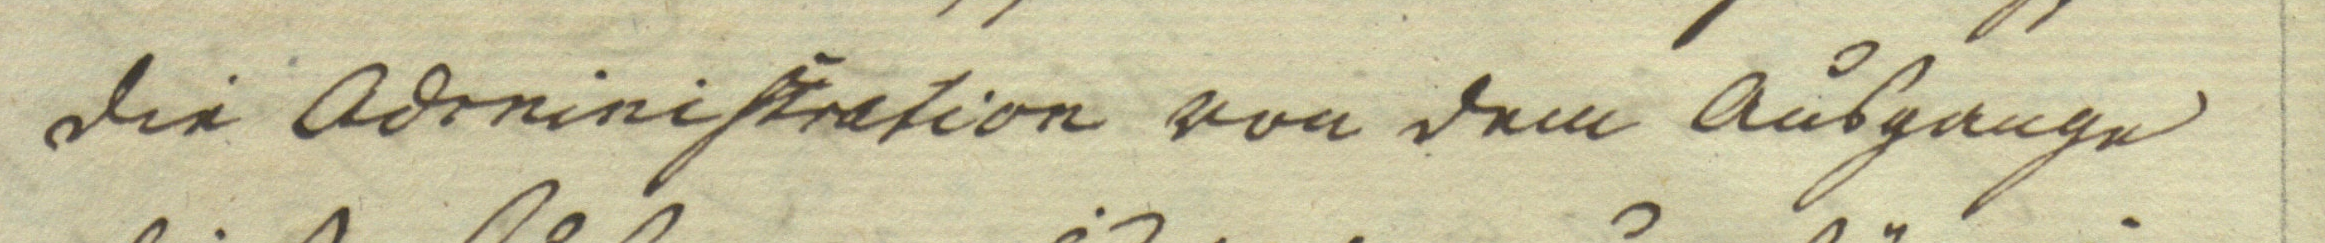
die Administration von dem Ausgange
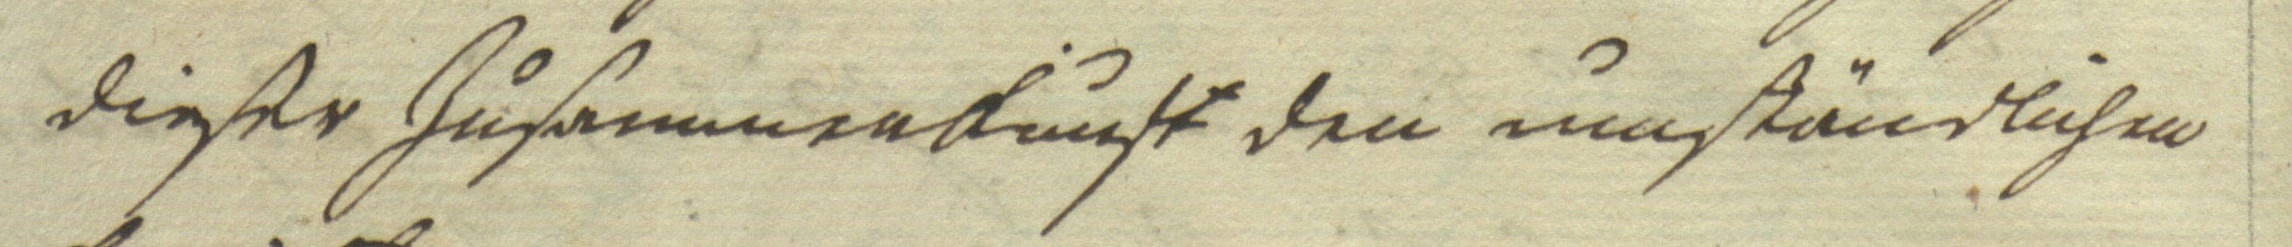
dieser Zusammenkunft den umständlichen
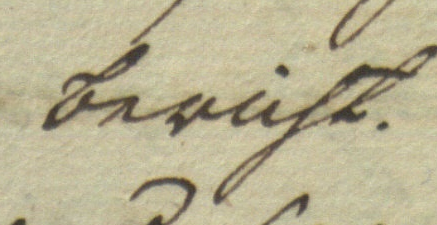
Bericht
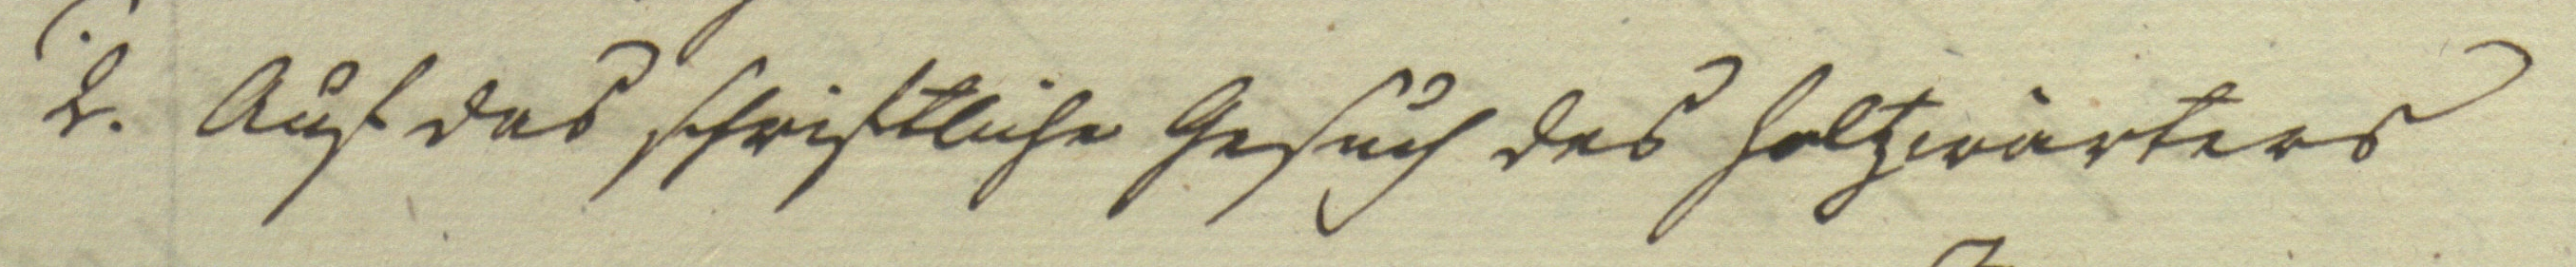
2. Auf das schriftliche Gesuch des Holtzwärters
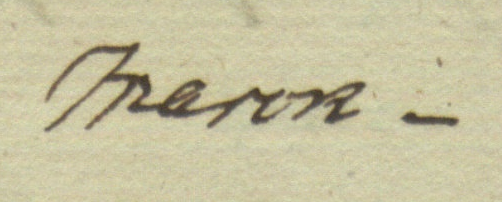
Marck¬
